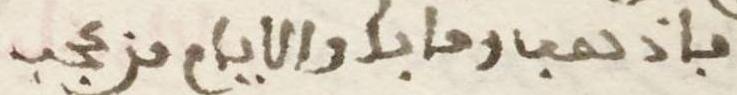فاذهب ومابك والايام من عجب
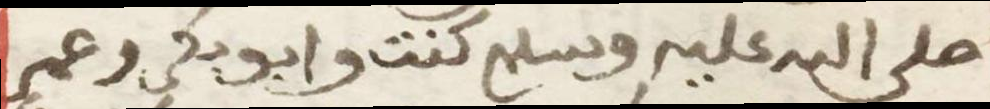صلى الله عليه وسلم كنت وابوبكر وعمر
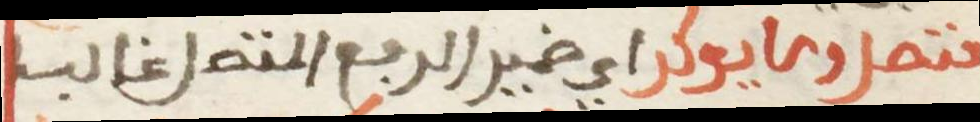متصل ولا يوكد اي ضمير الرفع المتصل غالبا
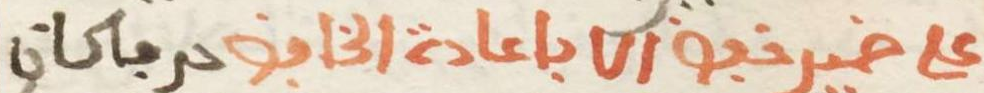على ضمير الا باعادة الخافض حرفا كان
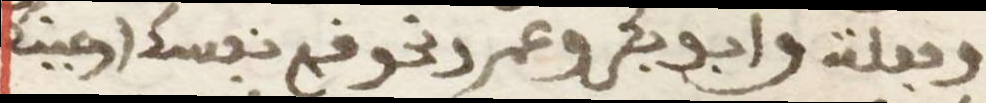وفعلت وابوبكر وعمر ونحو قم نفسك اوعينك
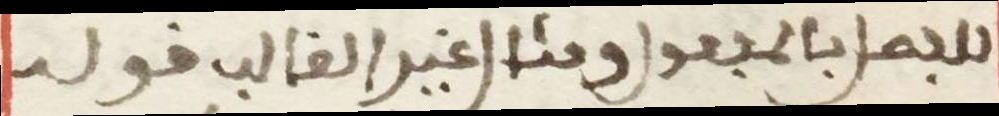للفصل بالمفعول ومثال غير الغالب قوله
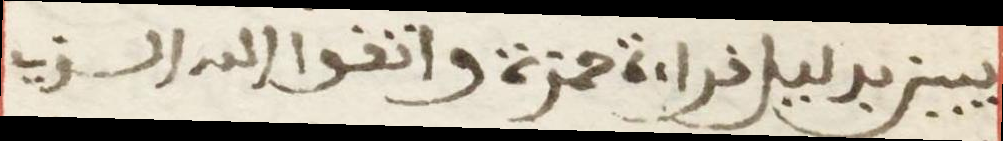يبن بدليل قراءة حمزة واتقوا الله الذي
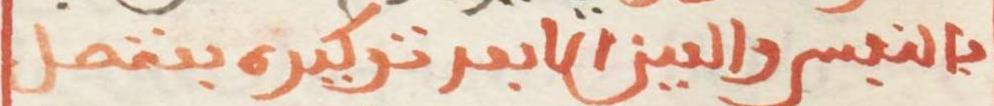بالنفس والعين الا بعد توكيده متصل
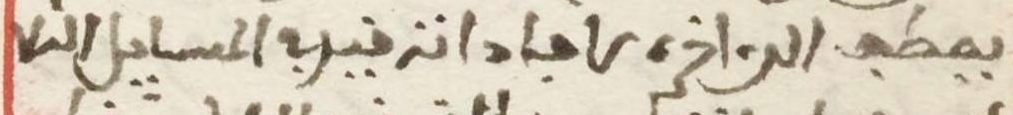يعطف الى ءاخره لاجاداته قيل في المسايل الثلا
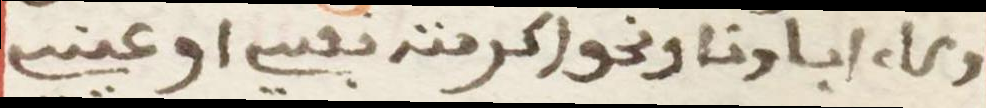ولا ءاباونا ونحواكرمته نفسي او عيني
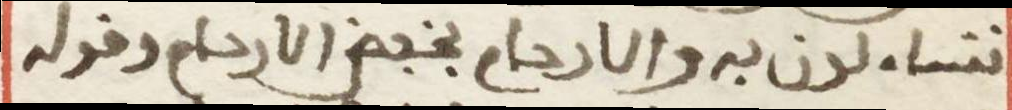تساءلون به والارحام بخفض الارحام وقوله
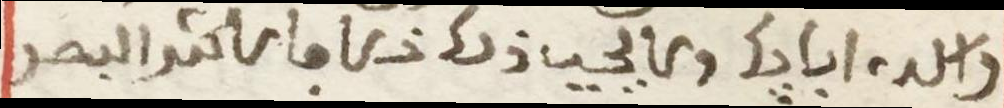واله ابائك ولا يجب ذلك خلافا لاشد البصر
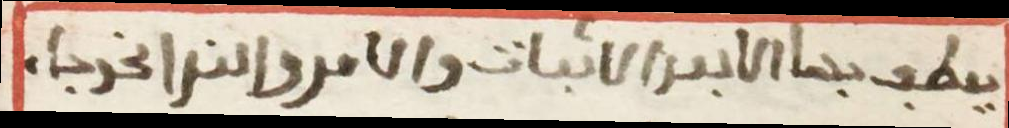يعطف بها الا بعد الاثبات والامر والندا نحو جاء
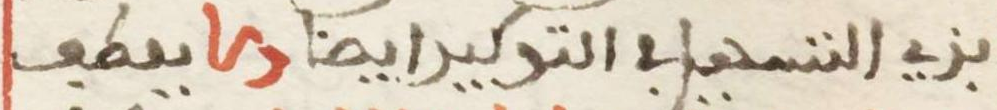بذي التسهيل في التوكيد ايضا ولا يعطف
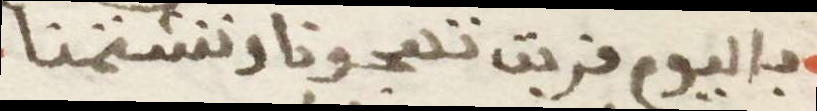فاليوم قربت تهجونا وتشتمنا
